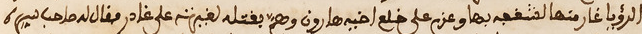الرؤيا غار منها لشغفه بها وعزم على خلع اخيه هارون وهمّ بقتله لغيرته على غادر مقال له صاحب سيره
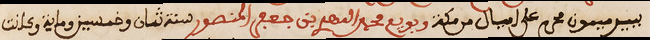ببير ميمون محرم على اميال من مكة وبويع محمد المهدى بن جعفر المنصور سنة ثمان وخمسين وماية وكانت
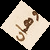وهان
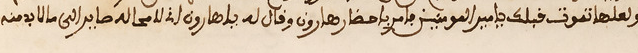ولعلها تموت قبلك يامير المومنين فامر باحضار هارون وقال له يا هارون انى لا محاله صاير الى ما لابد منه
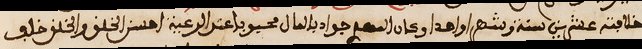خلافته عشرين سنة وشهرا واحدا وكان المهدى جواد بالمال محبوبا عند الرعية احسن الخلق والخلق خلف
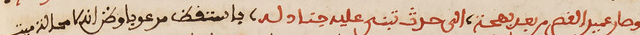وصار عميد القصر من بعد بهجة الى حدث تبنى عليه جادله فاستقظ من عوبا وظن انه لا محالة ميت
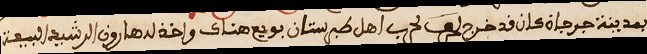بمدينة جرجان كان قد خرج لحرف لحرب اهل طبرستان بويع هناك واخذ له هارون الرشيد البيعة
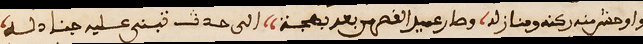واوحش منه ركنه منازله وصار عميد القصر من بعد بهجة الى حدث تبنى عليه جنادله
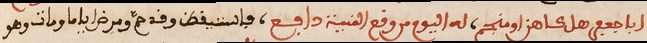ابا جععر هل كاهن او منجم له اليوم من وقع المنية دافع فاستيقظ وقد حمّ ومرض اياما ومات وهو
